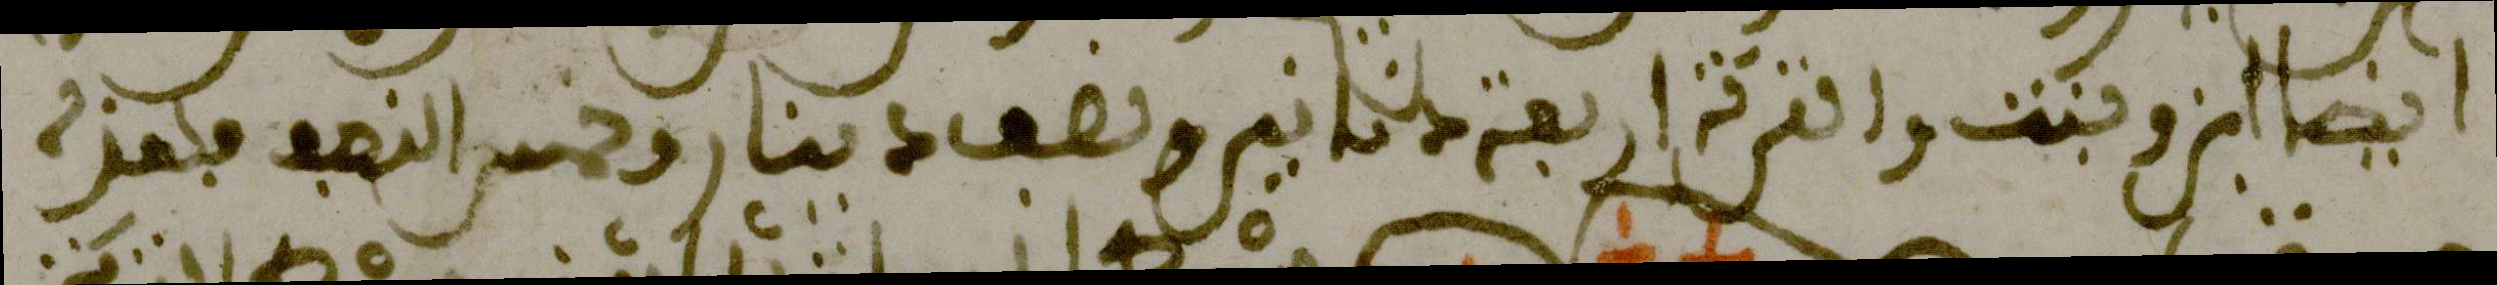ايضا ابن وبنت والتركة اربعة دنانير ونصف دينار وخمس النصف فهذه
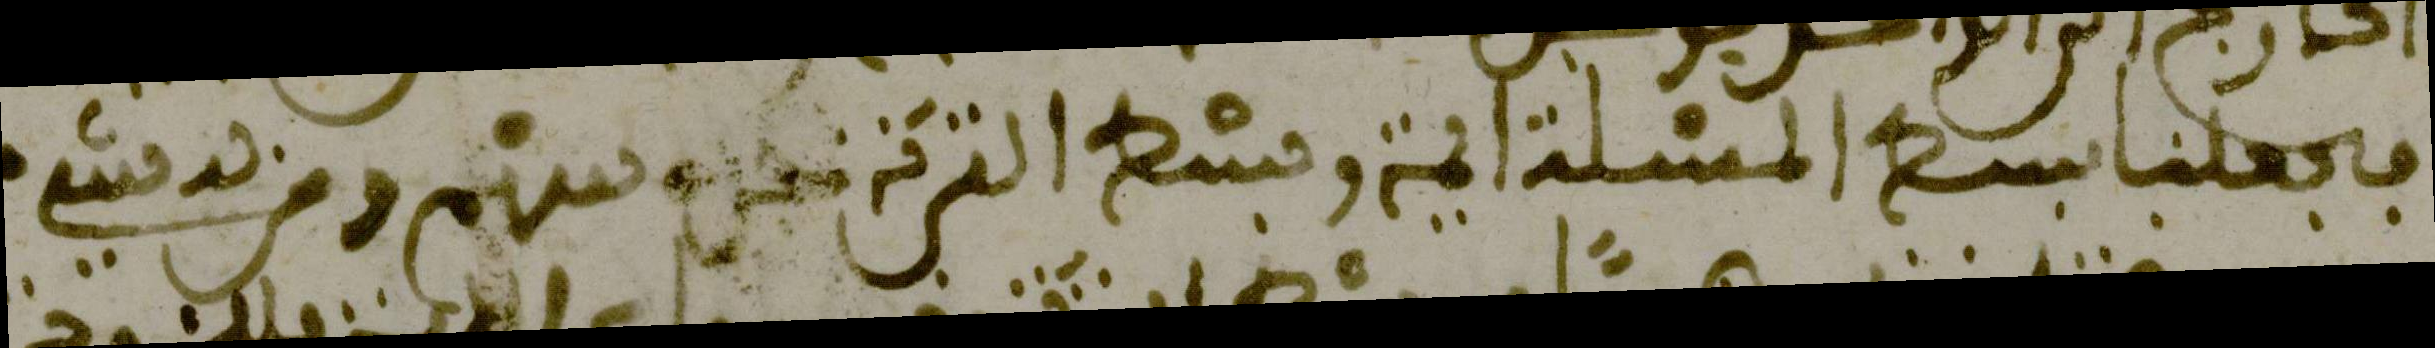فجعلنا بسط المسْلة ايمة بسْط التركة جزء سهْم ومن له شي
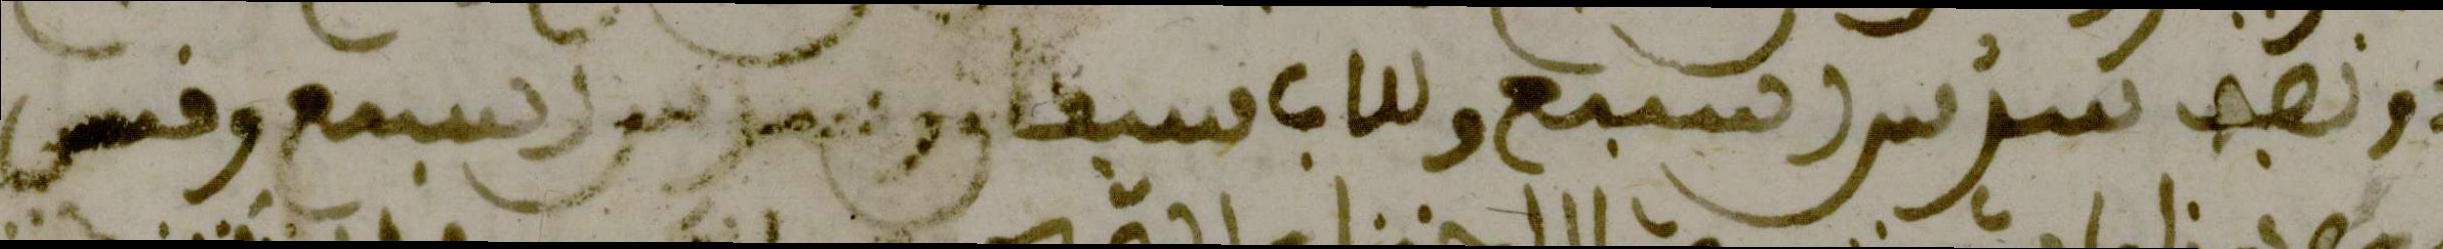ونصف سدس السبع وللاب فسبعان وسدس السبع وقس
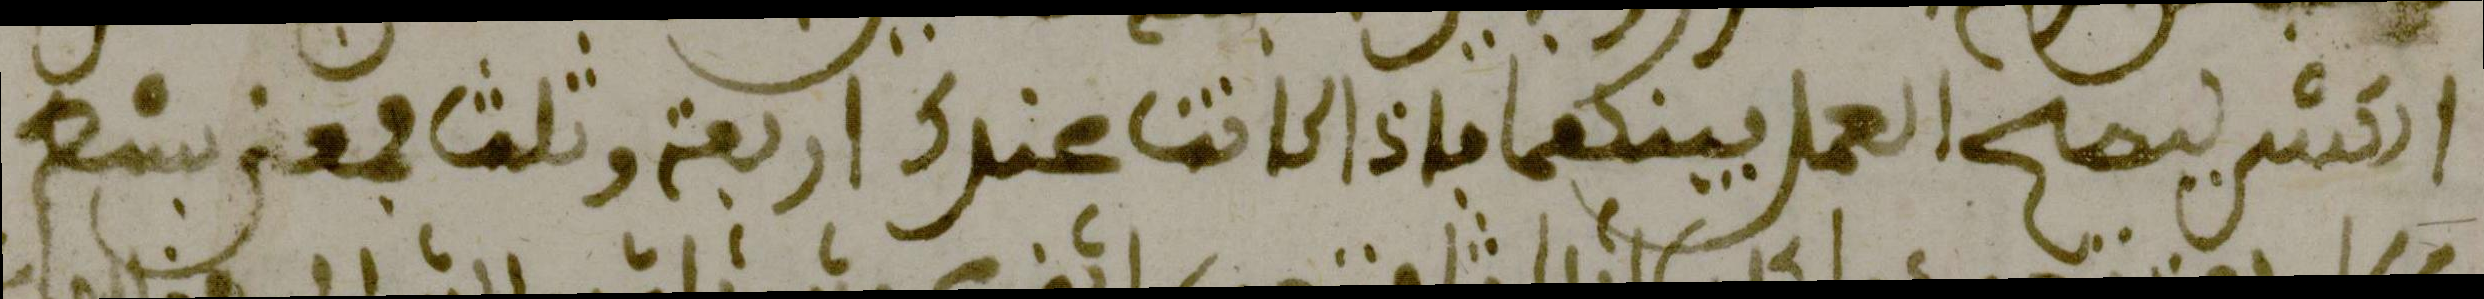الكسْر ليصح العمل بينهما فاذا كانت عندك اربعة وثلث فمعنى بسْط
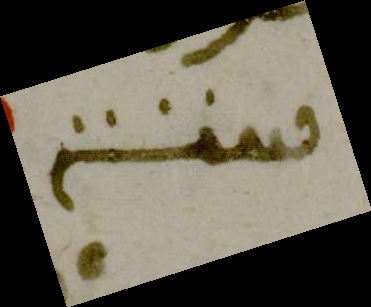ستة
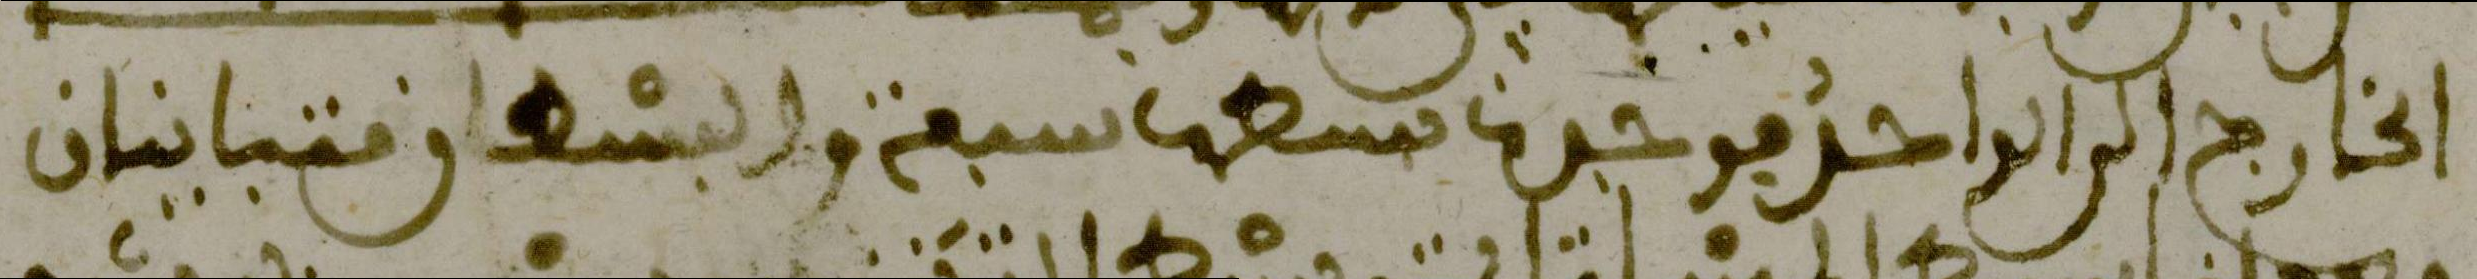الخارج الى الواحد فوجدنا بسطها سبعة البسْطان متباينان
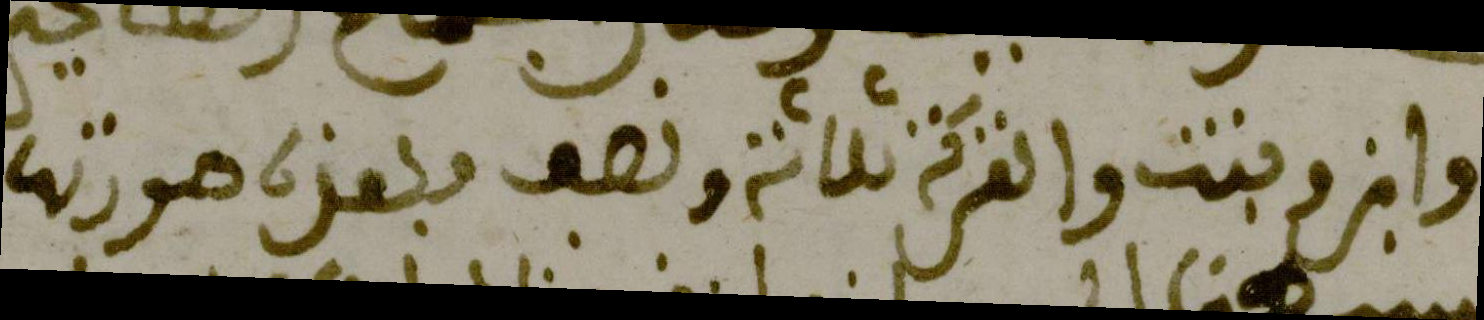وابن وبنت والتركة ثلاثة ونصف فهذه صورتها
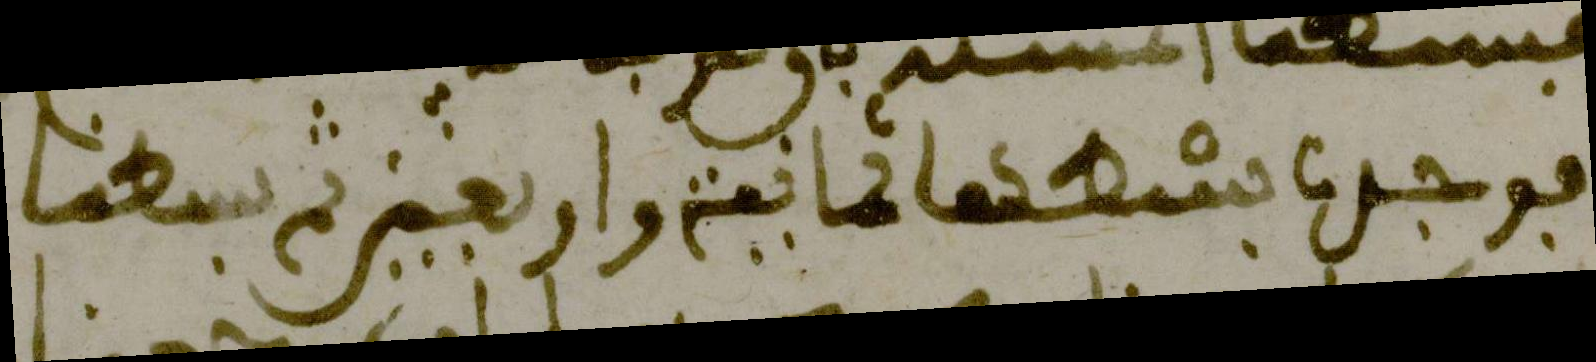فوجدنا بسْطها ثمانية واربعين ثم بسطنا
